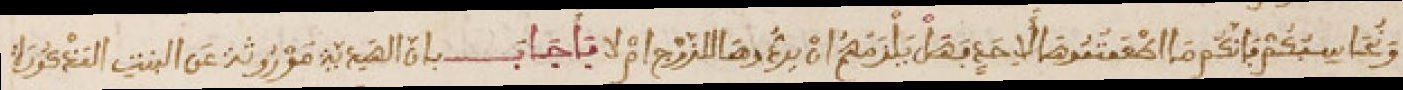ونحاسبكم فانكم ما اطعمتموها لأحد فهل يلزمهم ان يردوها للزوج ام لا فاجاب بان الهدية موروثة عن البنت المذكورة
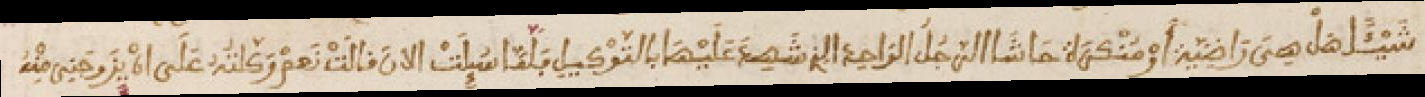شيئا هل هي راضية او منكرة حاشا الرجل الواحد الذي شهد عليها بالتوكيل فلما سئلت الان قالت نعم وكلته على ان يزوجني منه
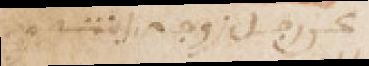عن رجل زوج ابنته ودخل بها
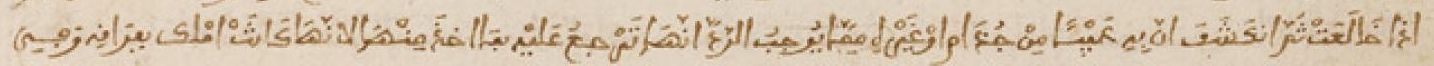اذا خالعت ثم انكشف ان به عيبا من جذام او غيره مما يوجب الرد انها ترجع عليه بما اخذ منها لانها كانت املك بفراقه وفي
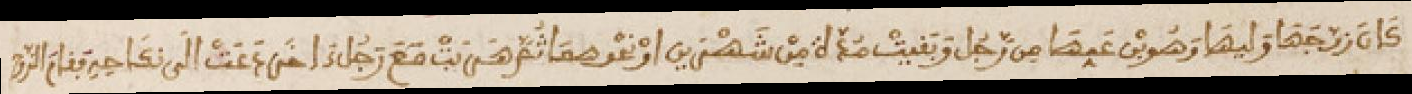كان زوجها وليها وهو بن عمها من رجل وبقيت مدة من شهرين او نحوها ثم هربت مع رجل اخر دعت الى نكاحه فقام الزوج
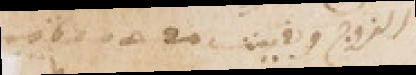الزوج وبقيت معه مدة
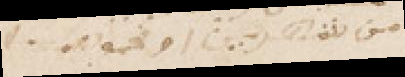من شهرين او نحوهما
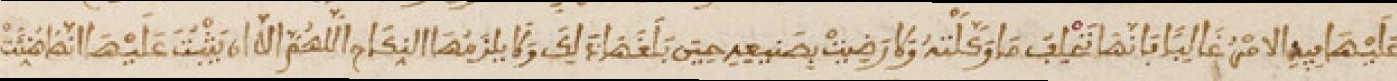عليها فيه الامر غالبا فانها تحلف انها ما وكلته ولا رضيت بصنيعه حين بلغها ذلك ولا يلزمها النكاح اللهم الا ان يثبت عليها انها هنئت
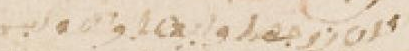كان زوجها وليها وهو ابن
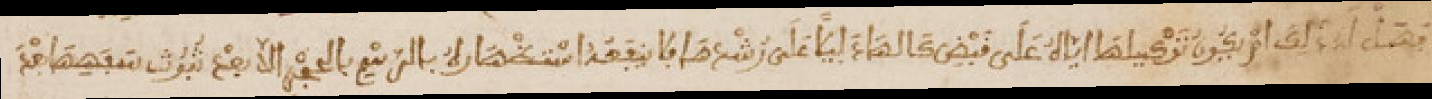فهل له ذلك ام يكون توكيلها اياه على قبض كالها دليلا على رشدها فلا ينفعه استضهاره بالرسم بالحجر الا بعد ثبوت سفهها بعد
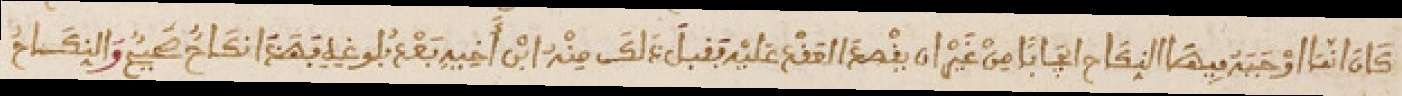كان انما اوجبه فيها النكاح إيجابا من غير ان يقصد العقد عليه فقبل ذلك منه ابن أخيه بعد بلوغه فهذا نكاح صحيح والنكاح
